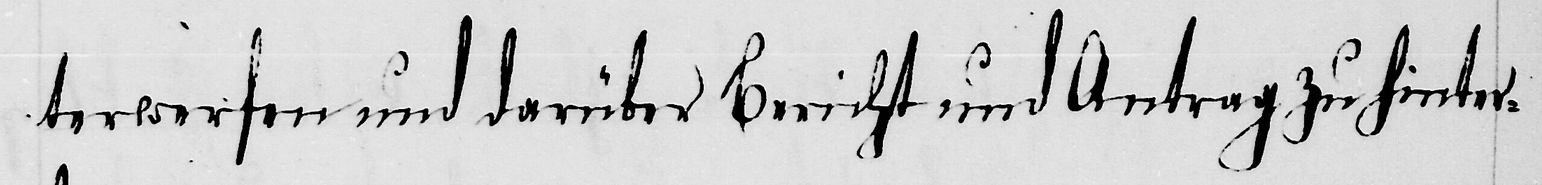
terwerfen und darüber Bericht und Antrag zu hinter¬
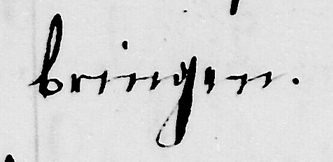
bringen.
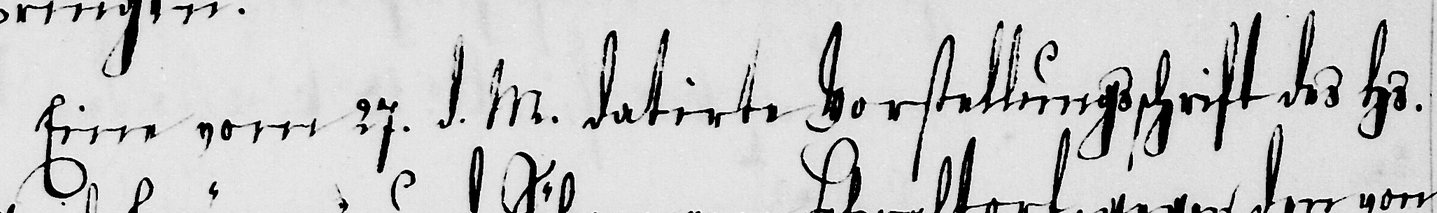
Eine vom 27. d. M. datirte Vorstellungsschrift des H¬
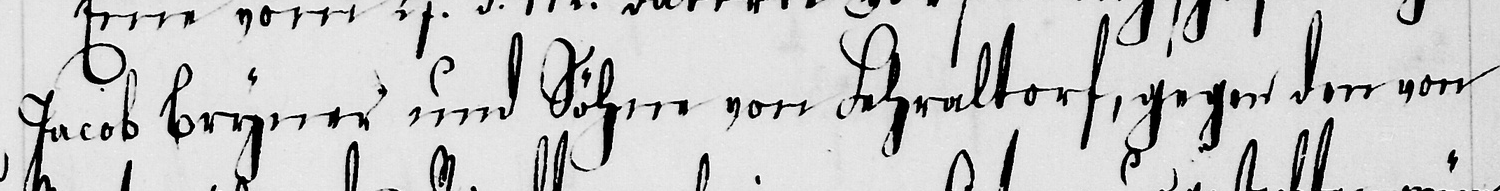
Jacob Bryner und Söhne von Fehraltorf, gegen den von
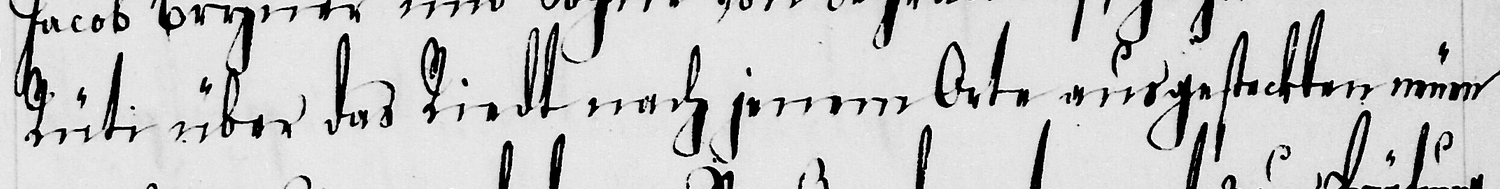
Rüti über das Riedt nach jenem Orte ausgesteckten neuen
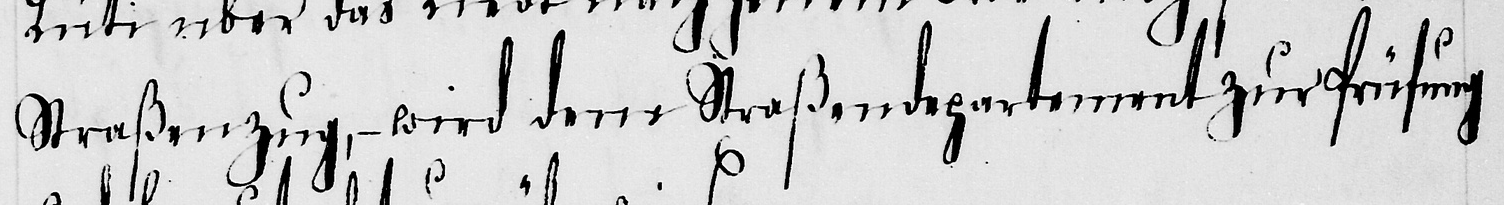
Straßenzug, – wird dem Straßendepartement zur Prüfung
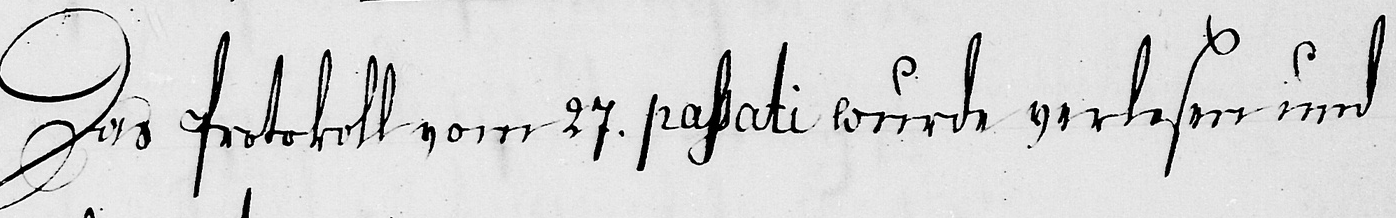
Das Protokoll vom 27. passati wurde verlesen und
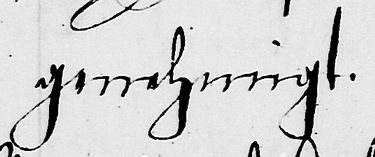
genehmigt.
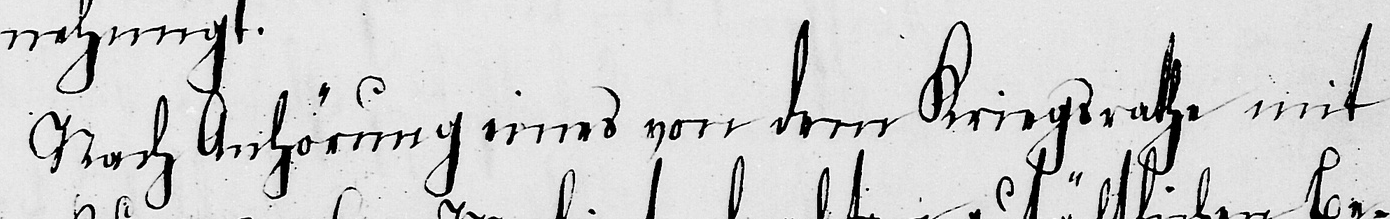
Nach Anhörung eines von dem Kriegsrathe mit
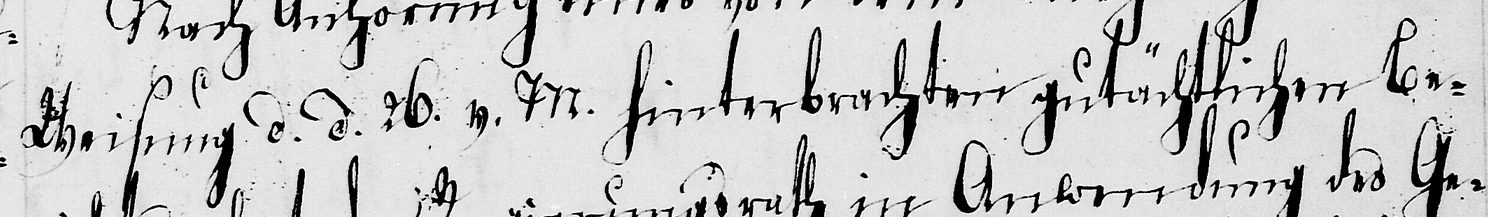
Weisung d. d. 26. v. M. hinterbrachten gutächtlichen Be¬
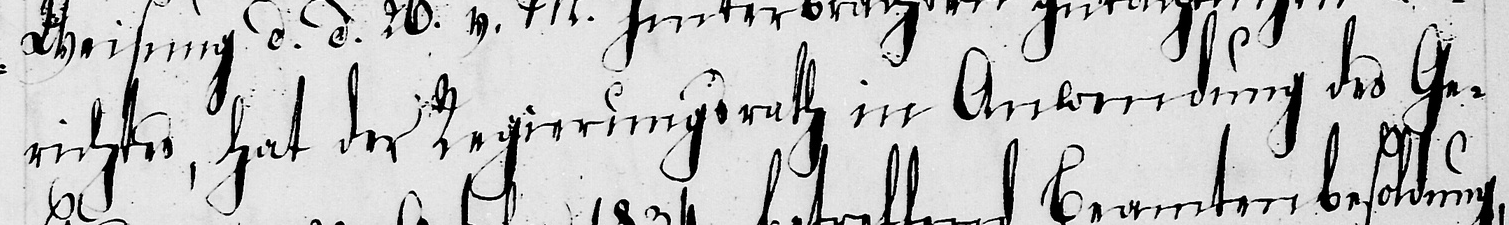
richtes, hat der Regierungsrath in Anwendung des Ge¬
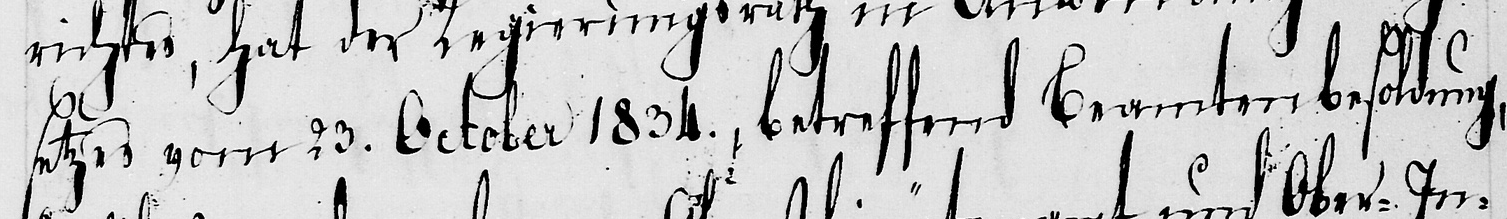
setzes vom 23. October 1834., betreffend Beamtenbesoldun¬
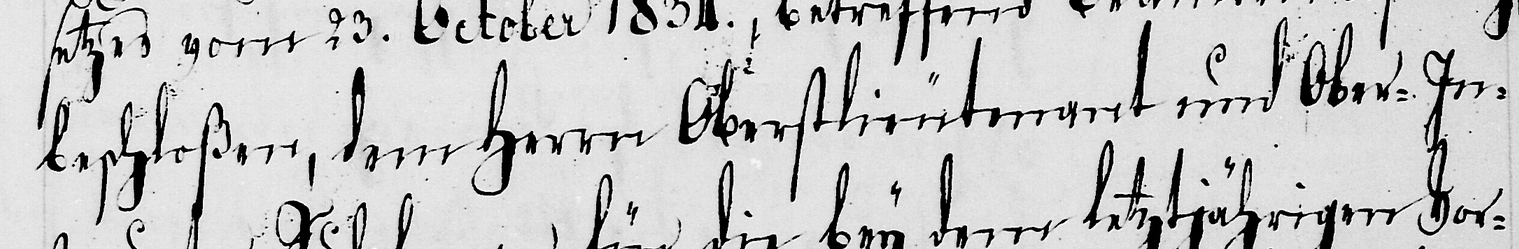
beschloßen, dem Herrn Oberstlieutenant und Ober-In¬
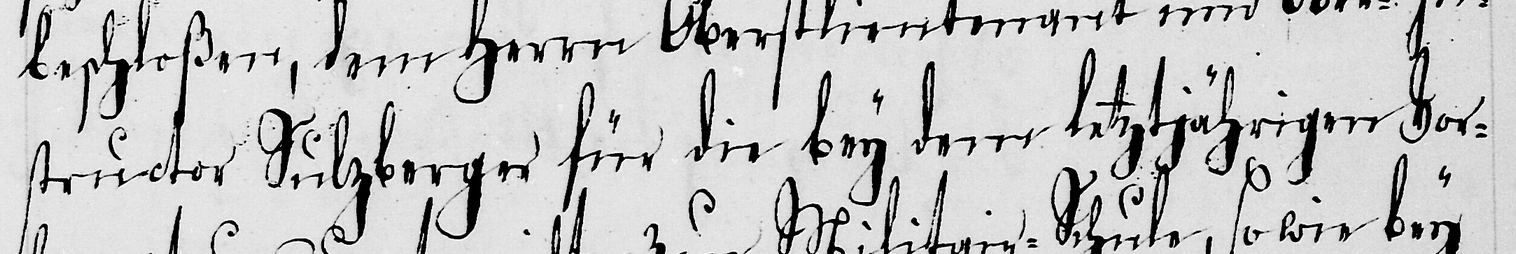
structor Sulzberger für die bey dem letztjährigen Vor¬
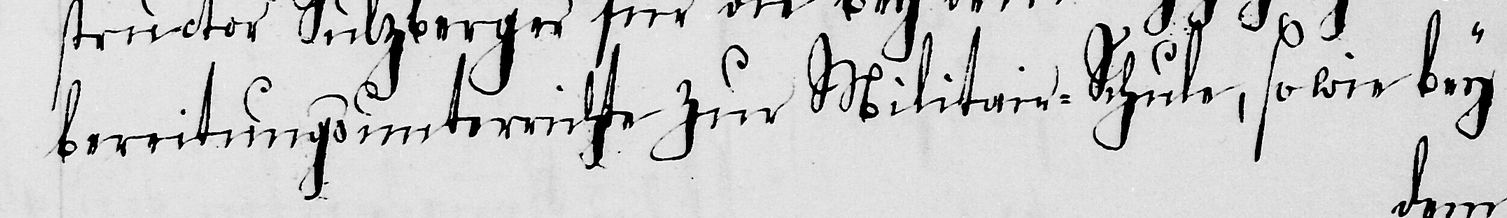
bereitungsunterrichte zur Militair-Schule, sowie bey
